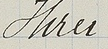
Ihrer
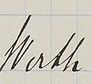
letzten
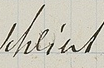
haben
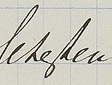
keinen
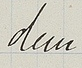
Berlin
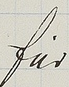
eine
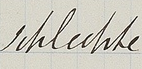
schlechte
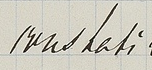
constatiren.
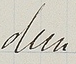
halten
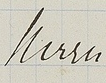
Herrn
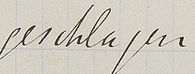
sehr niedergeschlagen
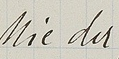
scheint, weil
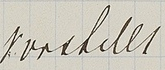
vorstellt,
